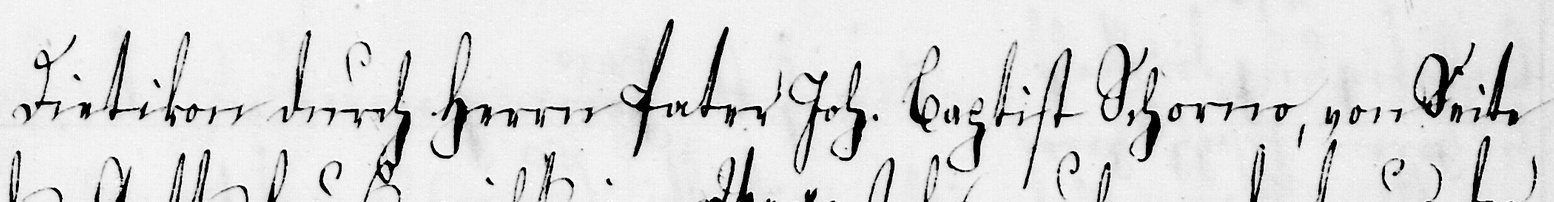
Dietikon durch Herrn Pater Joh. Baptist Schorno, von Seite
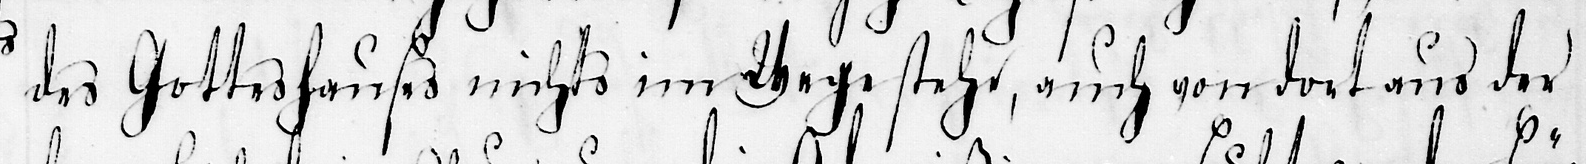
des Gotteshauses nichts im Wege stehe, auch von dort aus der
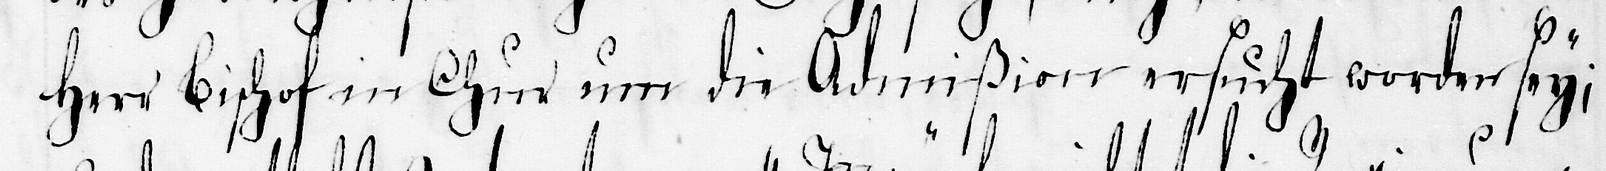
Herr Bischof in Chur um die Admißion ersucht worden sey;
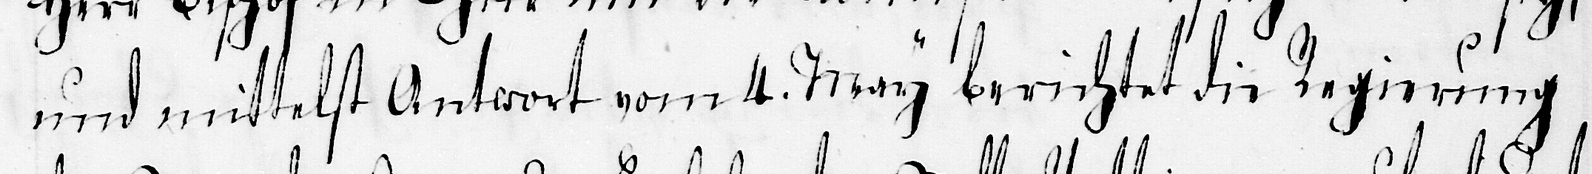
und mittelst Antwort vom 4. May berichtet die Regierung
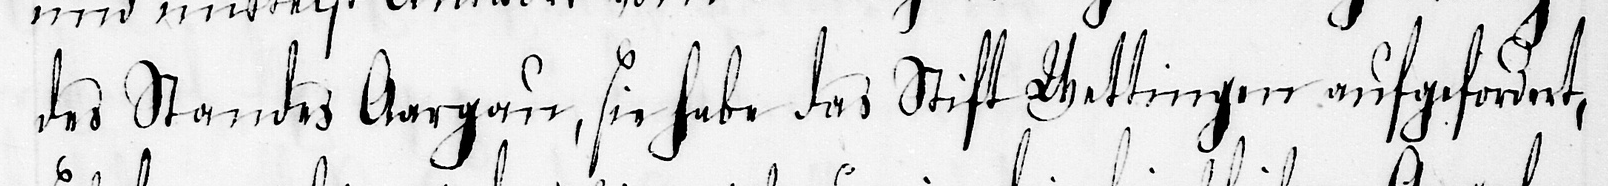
des Standes Aargau, sie habe das Stift Wettingen aufgefordert,
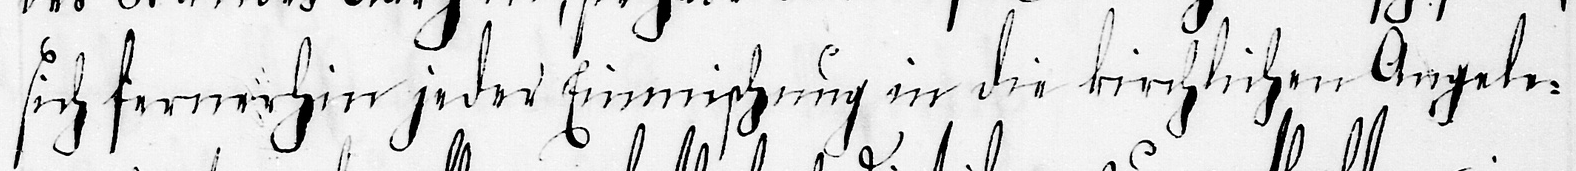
sich fernerhin jeder Einmischung in die kirchlichen Angele¬
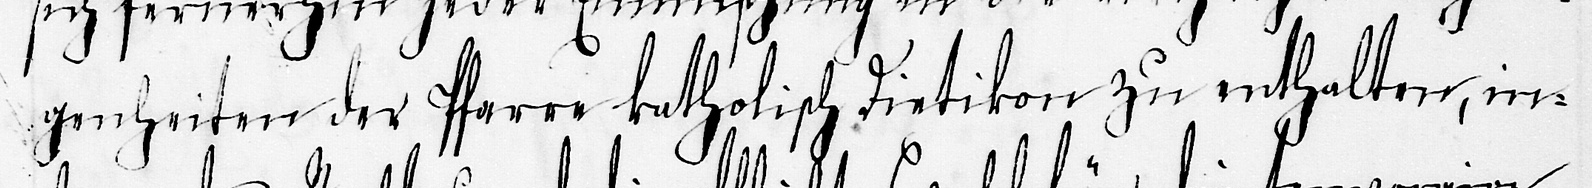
genheiten der Pfarre katholisch Dietikon zu enthalten, in¬
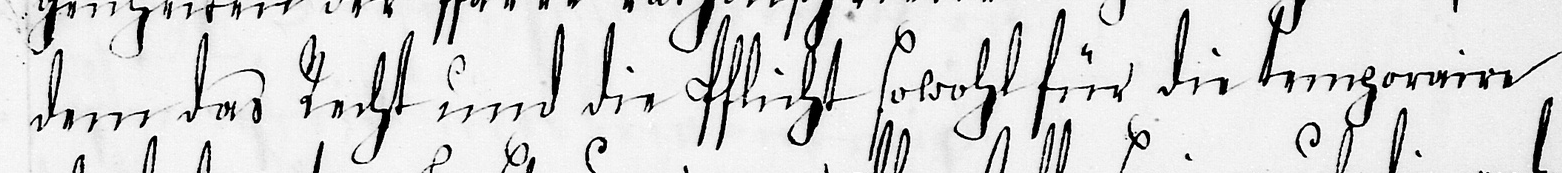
dem das Recht und die Pflicht sowohl für die temporaire
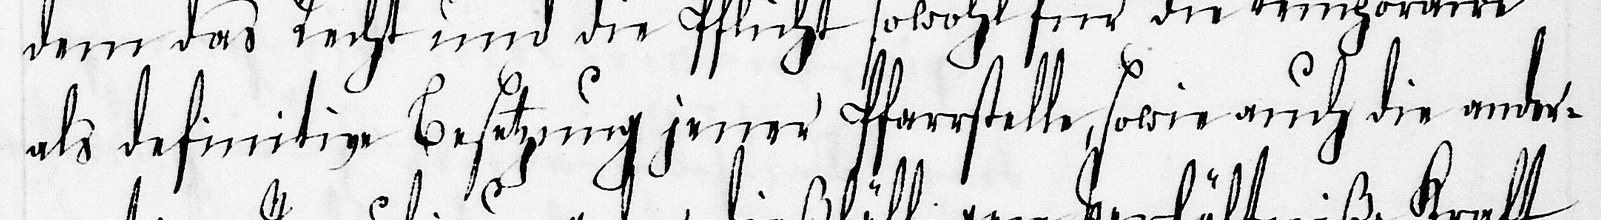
als definitive Besetzung jener Pfarrstelle, sowie auch die ander¬
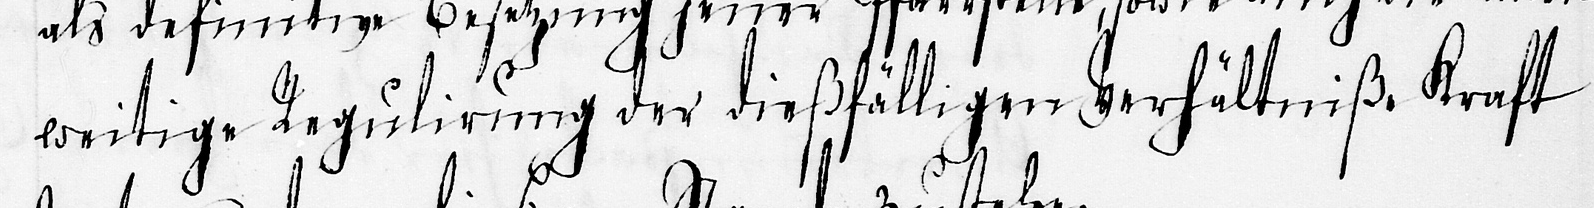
weitige Regulirung der dießfälligen Verhältniße Kraft
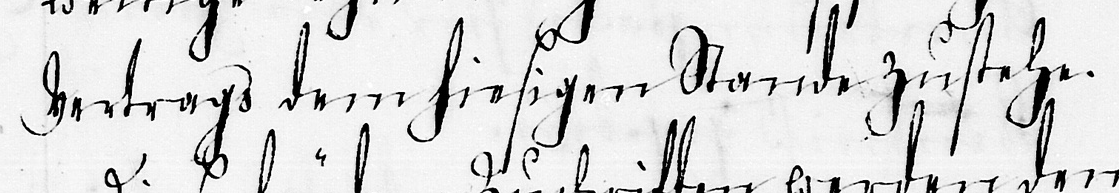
Vertrags dem hiesigen Stande zustehe.
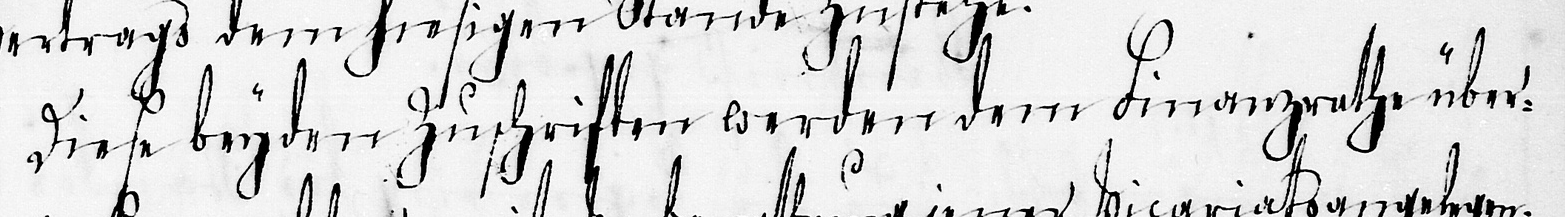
Diese beyden Zuschriften werden dem Finanzrathe über¬
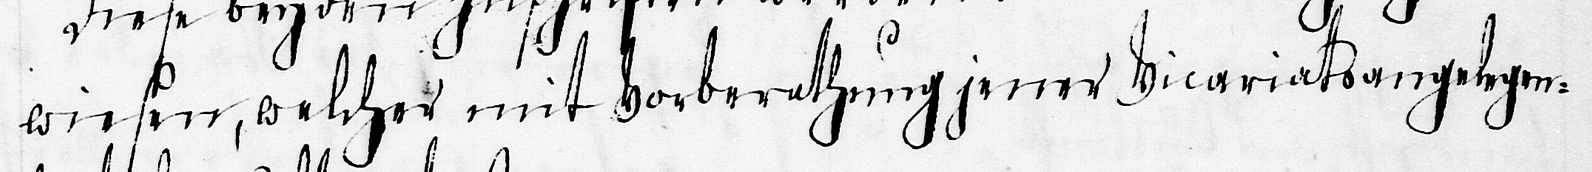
wiesen, welcher mit Vorberathung jener Vicariatsangelegen¬
